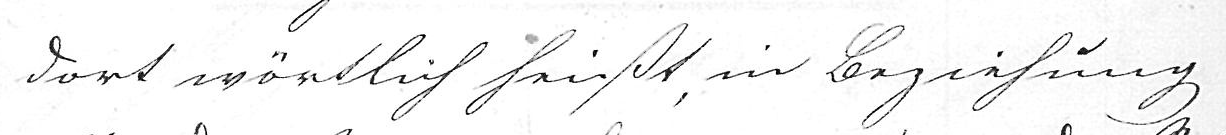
dort wörtlich heißt, in Beziehung
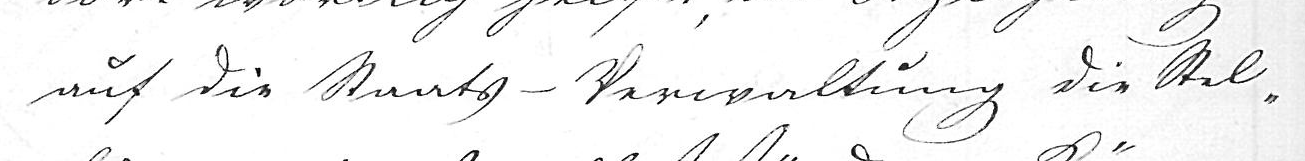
auf die Staats-Verwaltung die Stel-
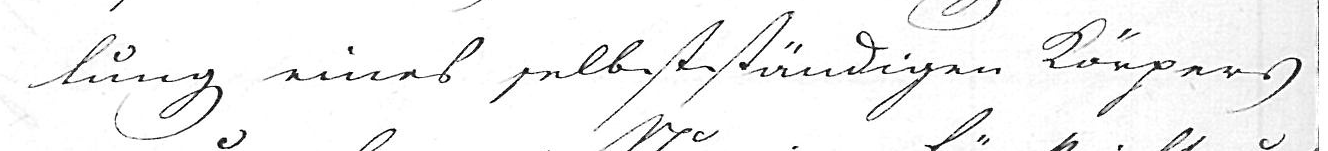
lung eines selbstständigen Körpers
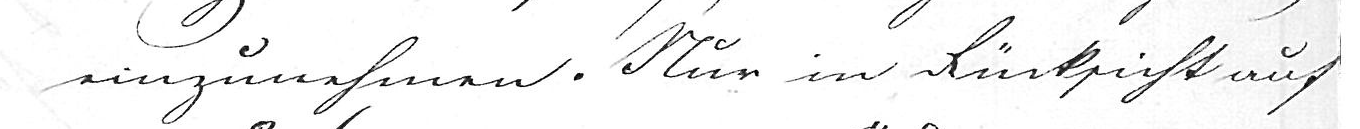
einzunehmen. Nur in Rücksicht auf
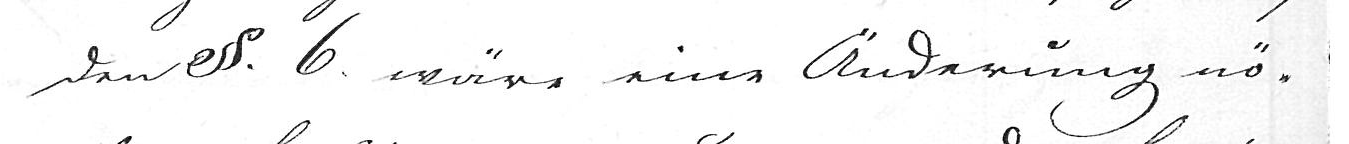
den §.6. wäre eine Änderung nö-
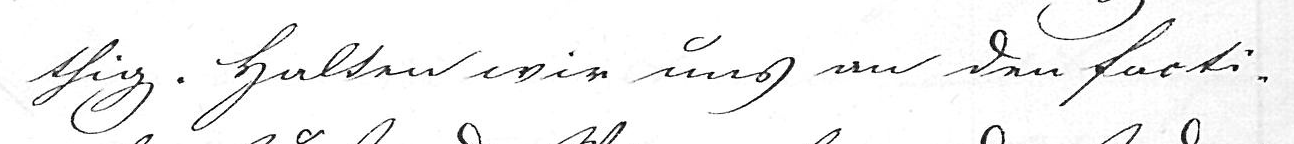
thig. Halten wir uns an den facti-
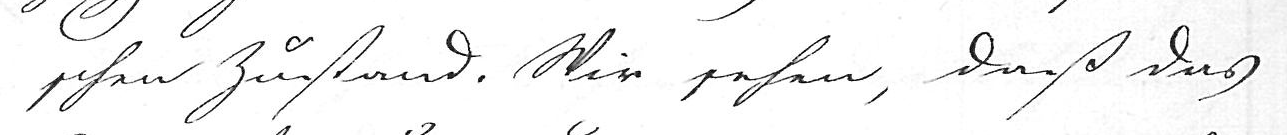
schen Zustand. Wir sehen, daß das
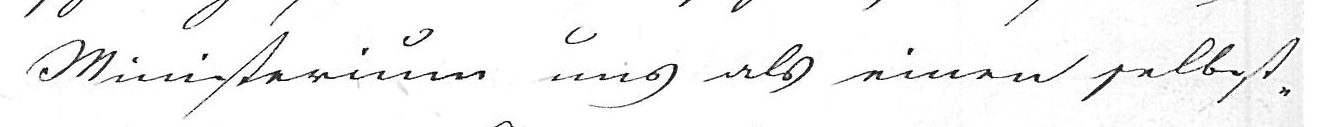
Ministerium uns als einen selbst-
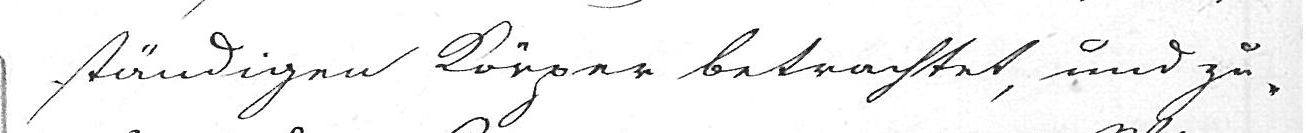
ständigen Körper betrachtet, und zu-
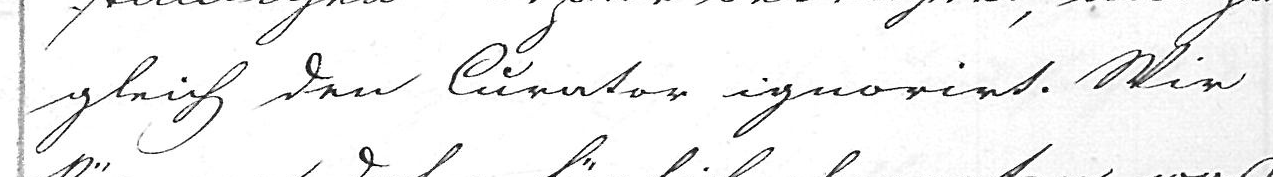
gleich den Curator ignorirt. Wir
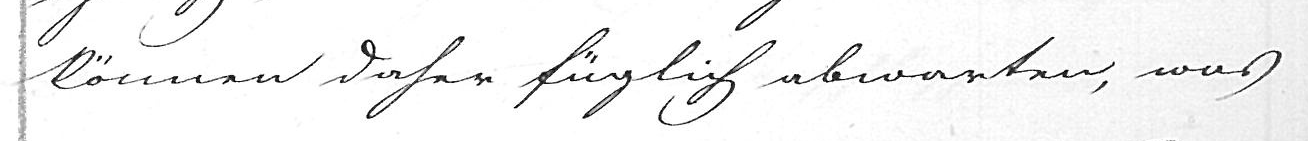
können daher füglich abwarten, was
